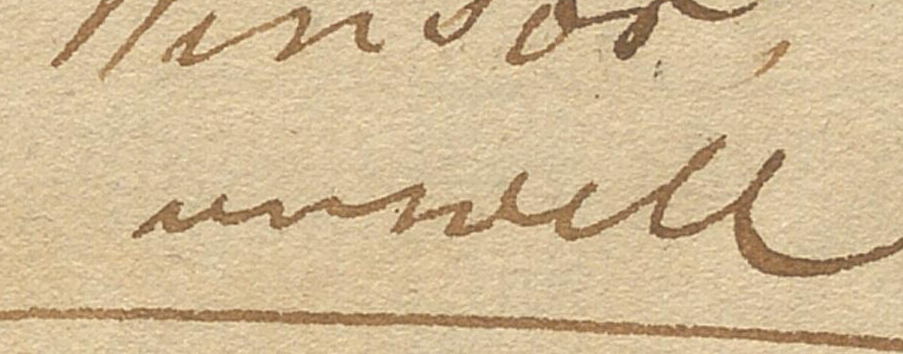unwell
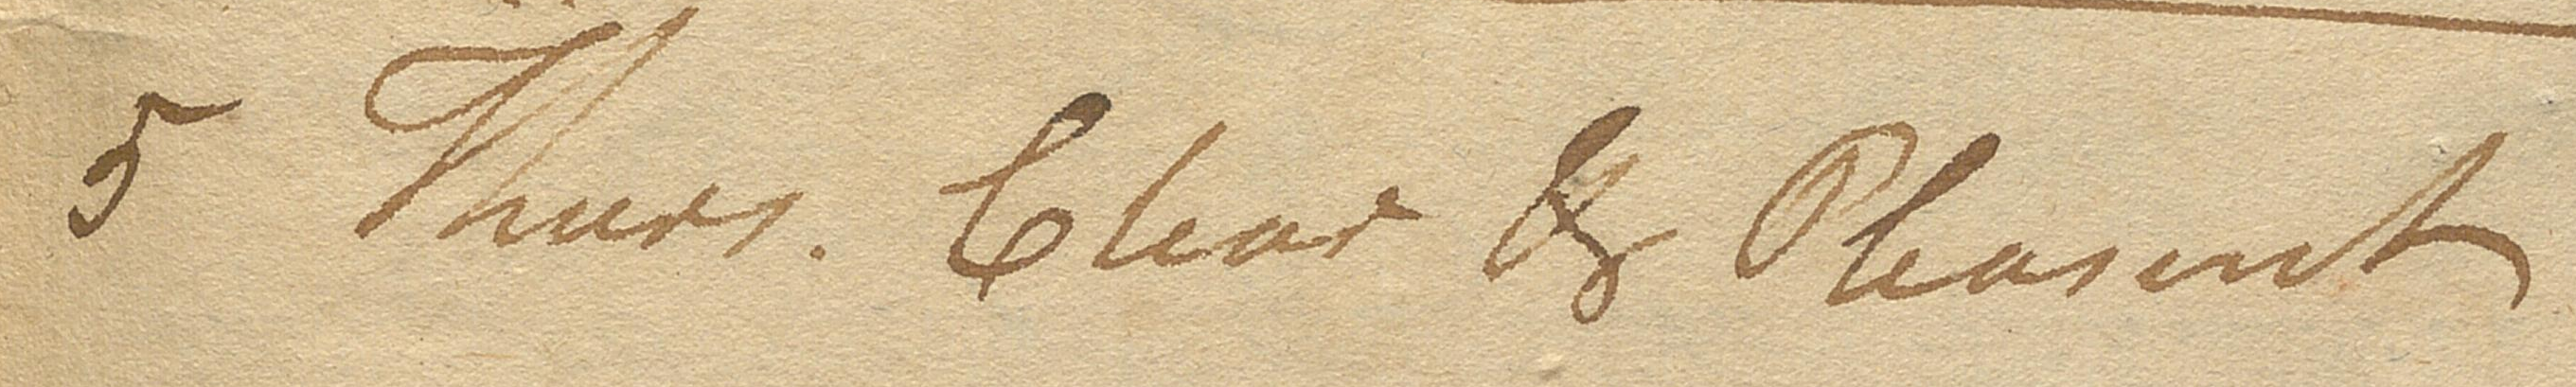5 Thurs. Clear & Pleasent
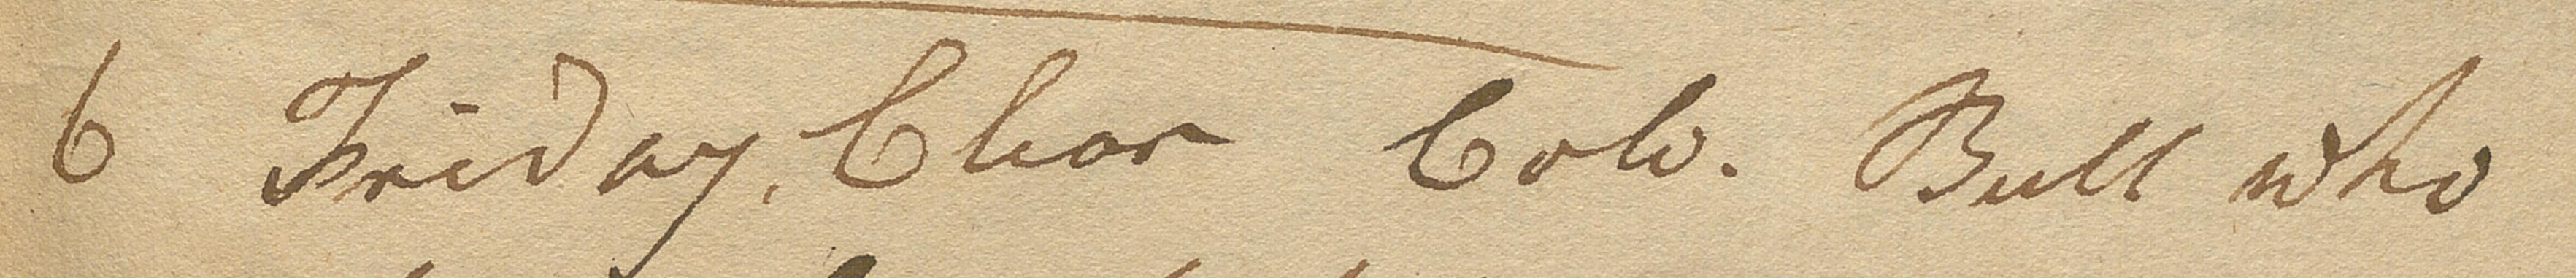6 Friday. Clear Colo. Bull who
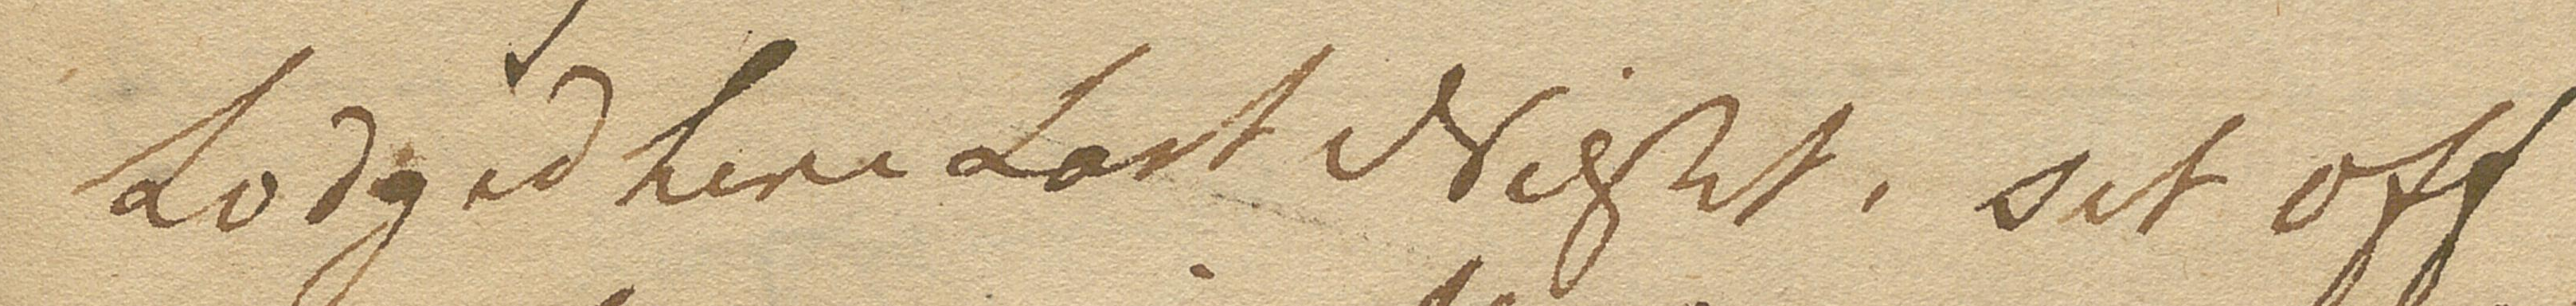Lodged here Last Night, set off
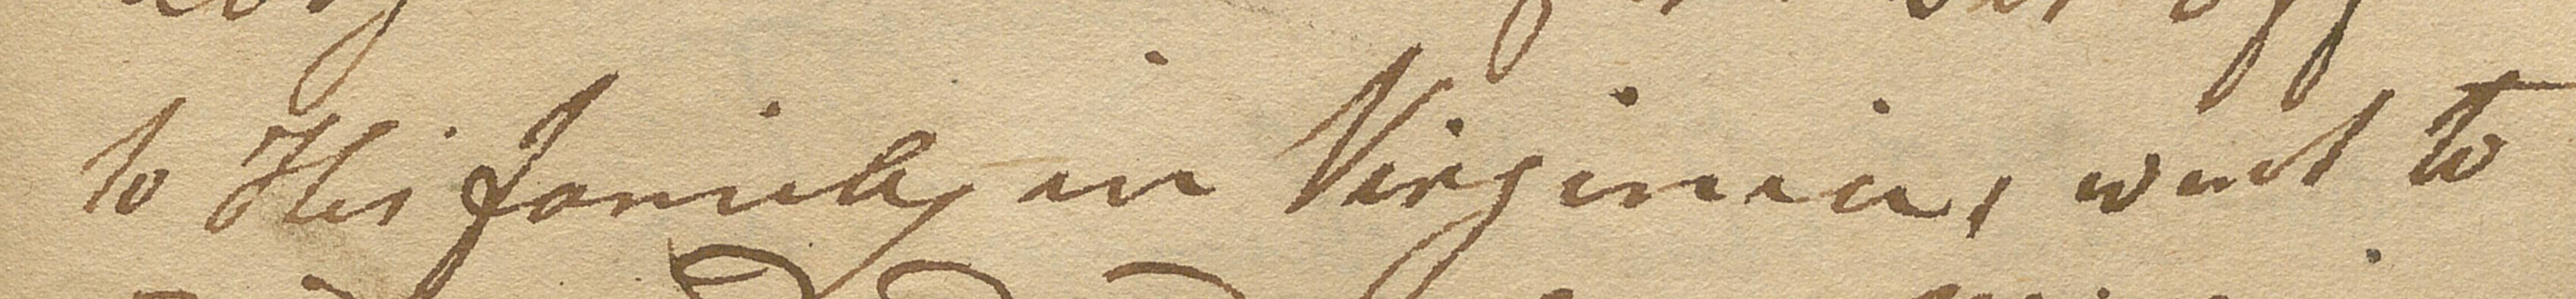to His family an Virginia, went to
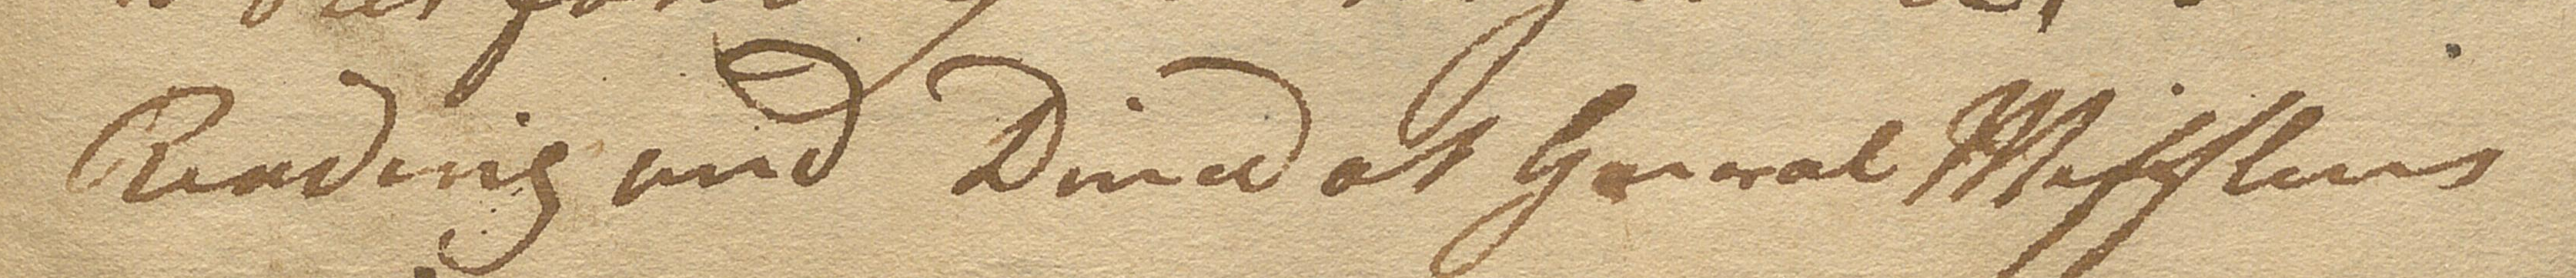Reading and Dined at Genaral Mifflins
